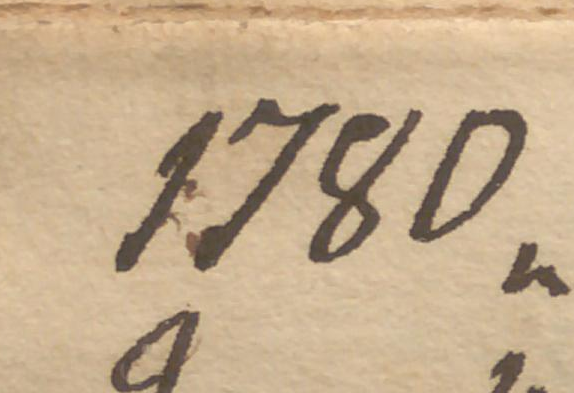1780
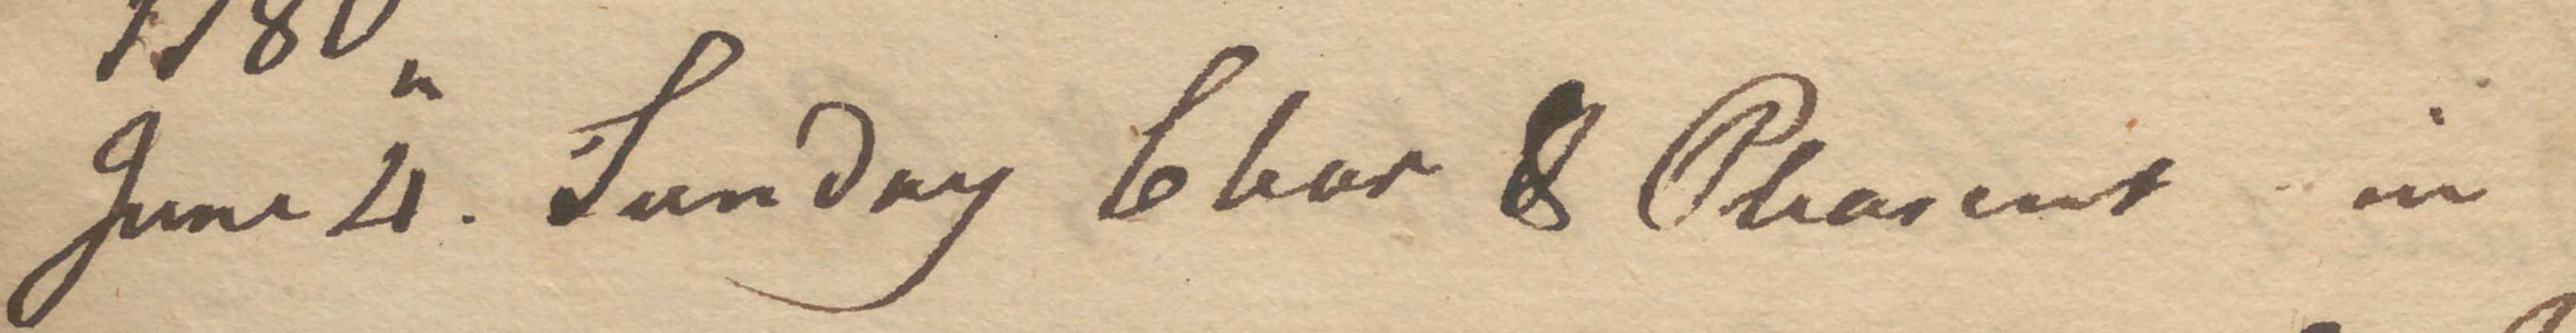June 4^th. Sunday Clear & Pleasent in
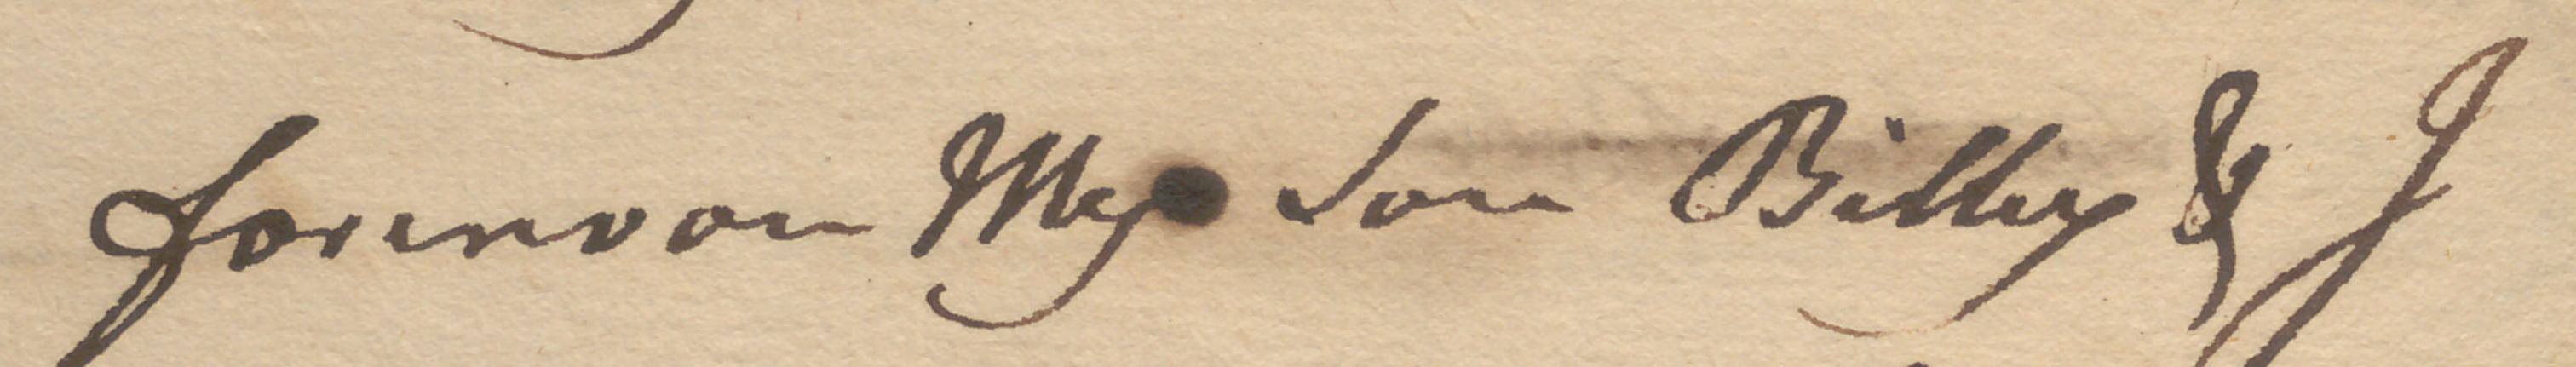forenoon My Son Billey & I
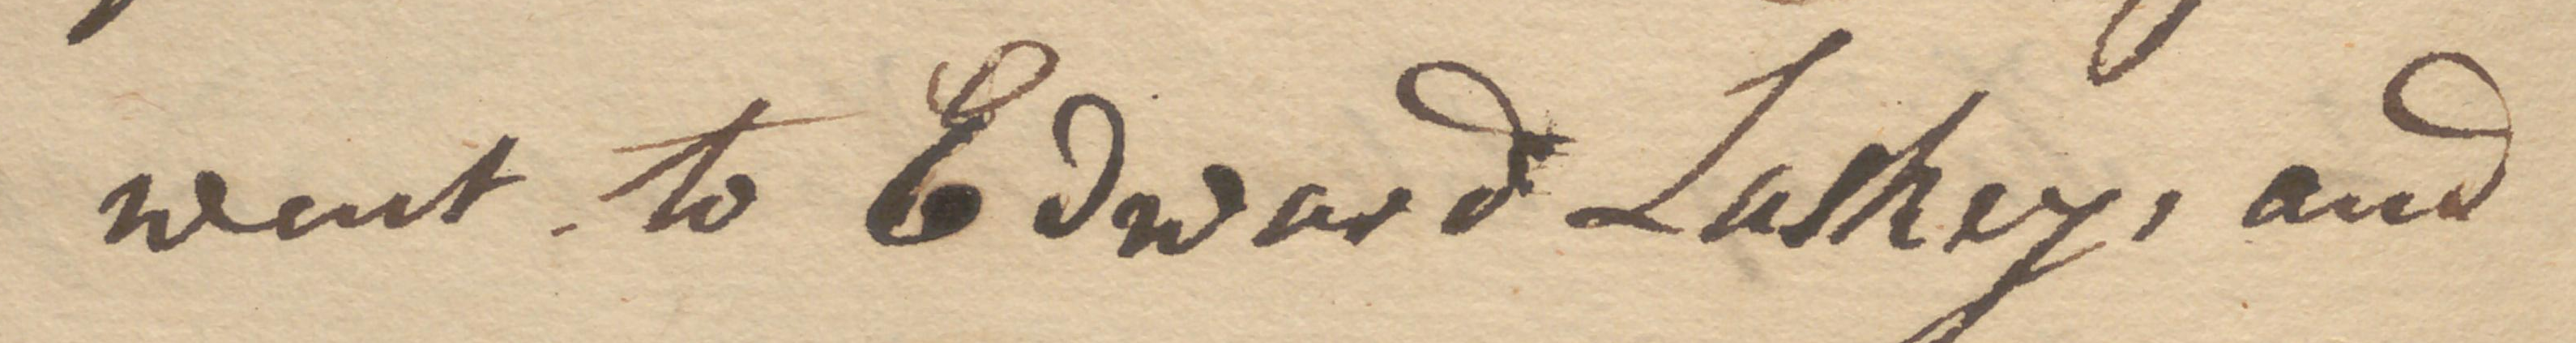went to Edward Laskeys and
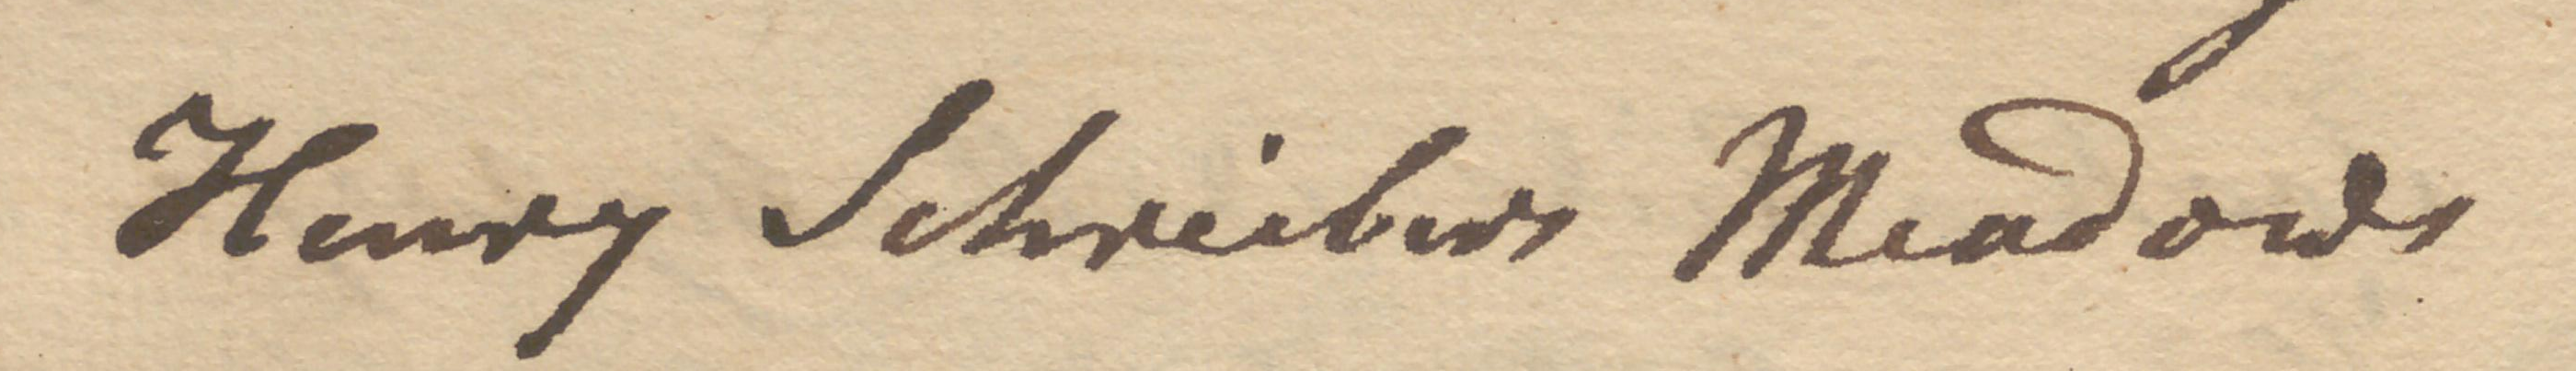Henry Schreibers Meadows
